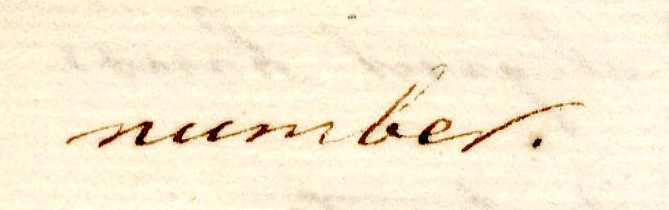number.
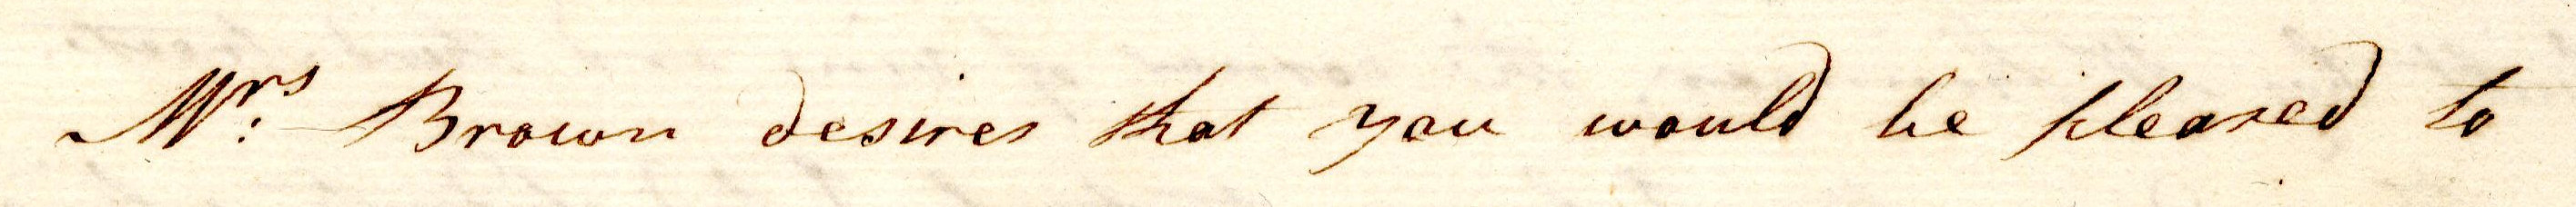M^rs. Brown desires that you would be pleased to
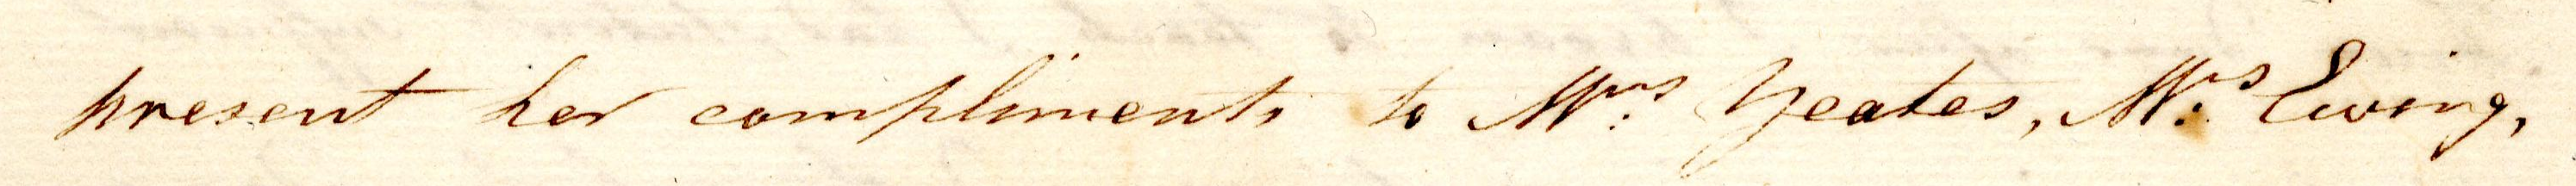present her compliments to M^rs. Yeates, M^rs. Ewing,
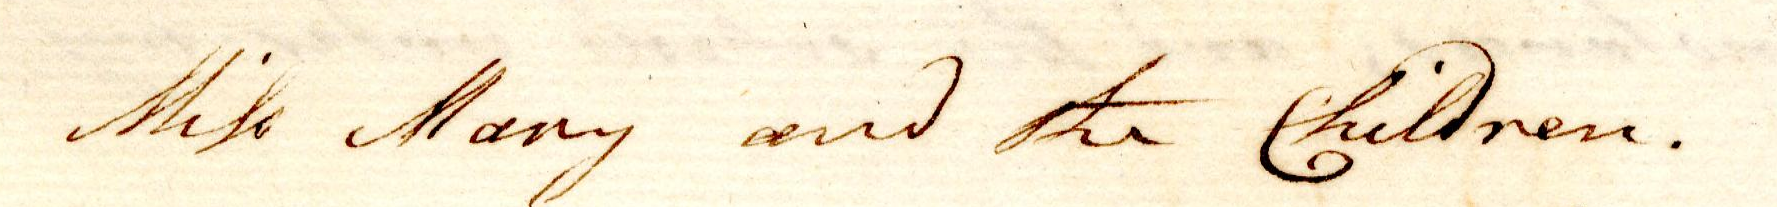Miss Mary and the Children.
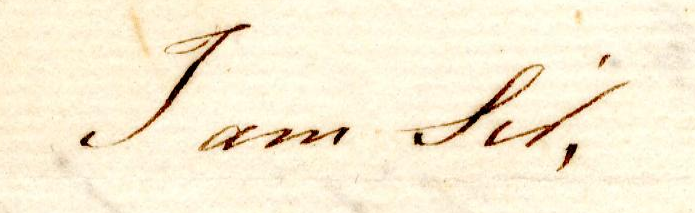I am Sir,
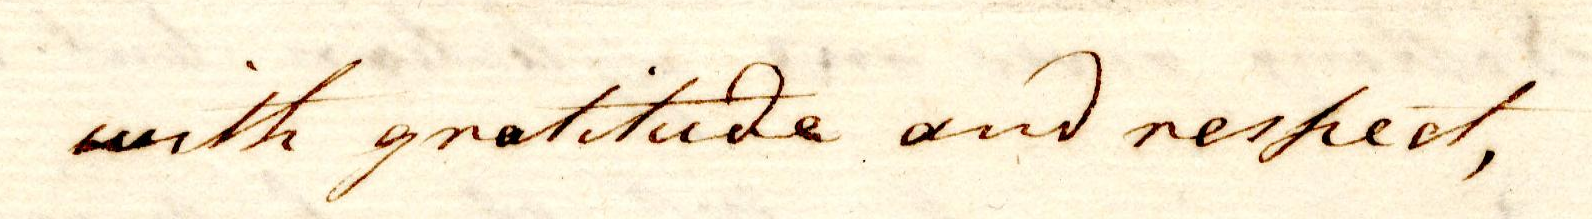with gratitude and respect,
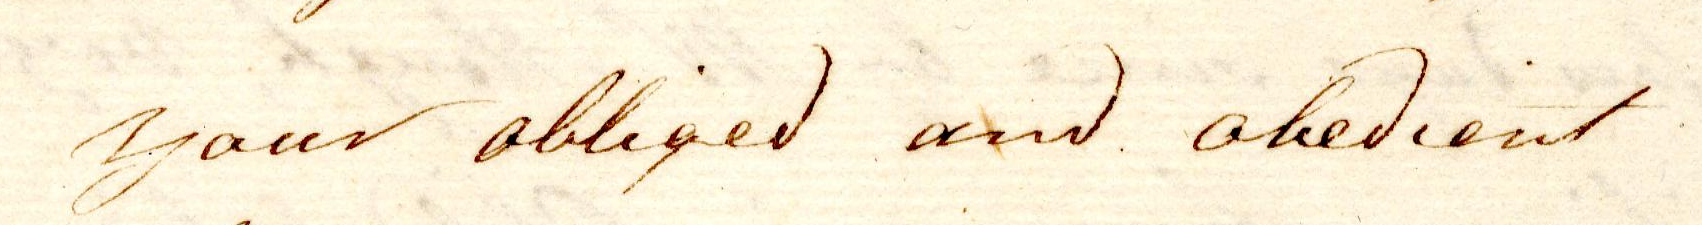your obliged and obedient
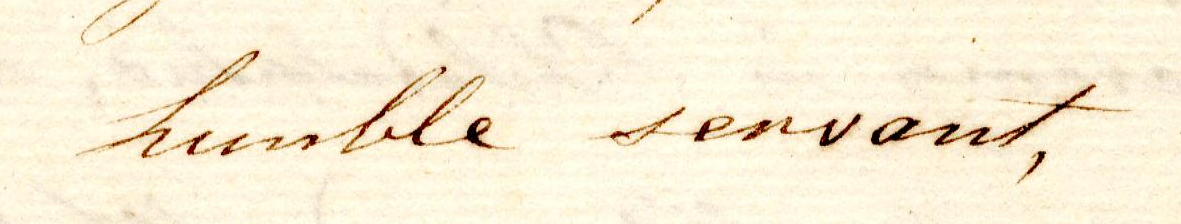humble servant,
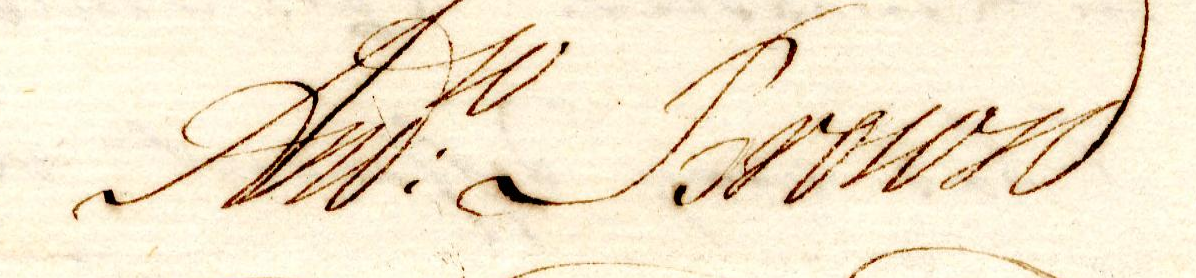And^w: Brown
